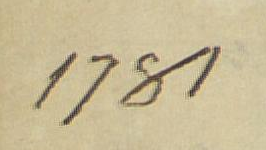1781
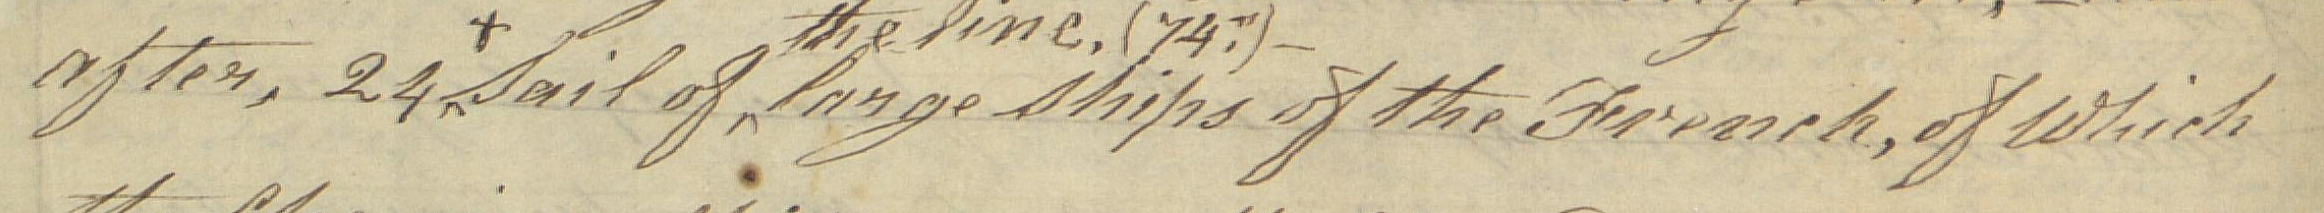after, 24 ^ Sail of ^ large Ships of the French, of which
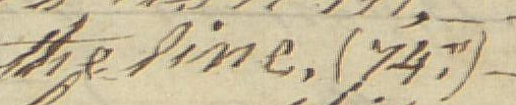the line (74.)
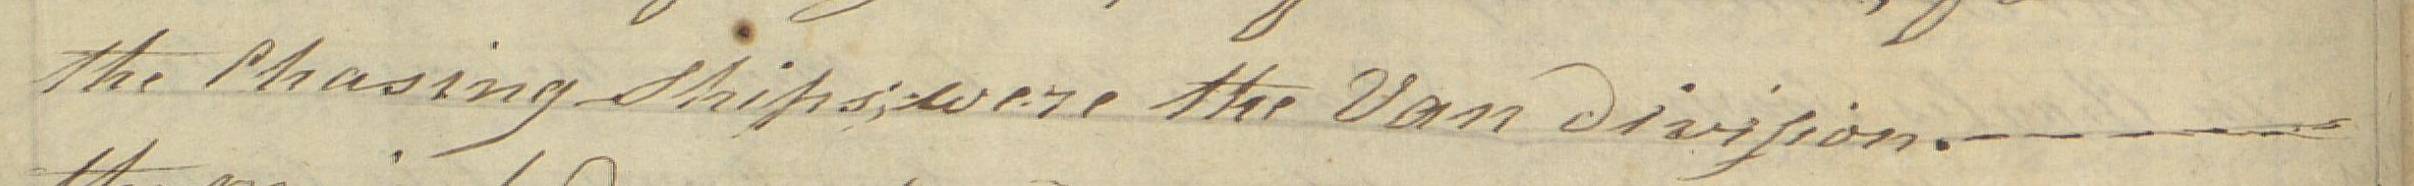the Chasing Ships, were the Van division.
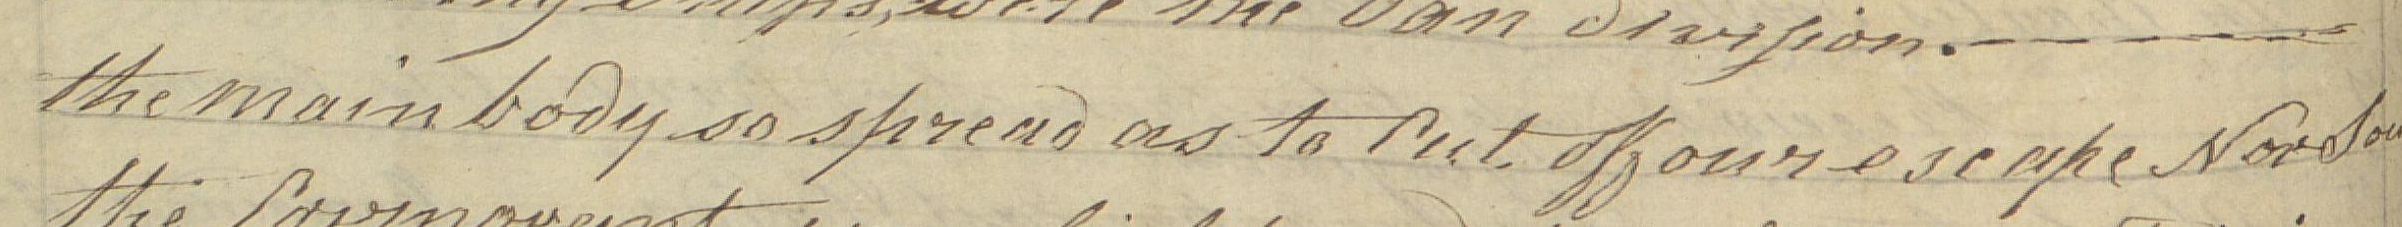the main body so spread as to cut off our escape Nor T-
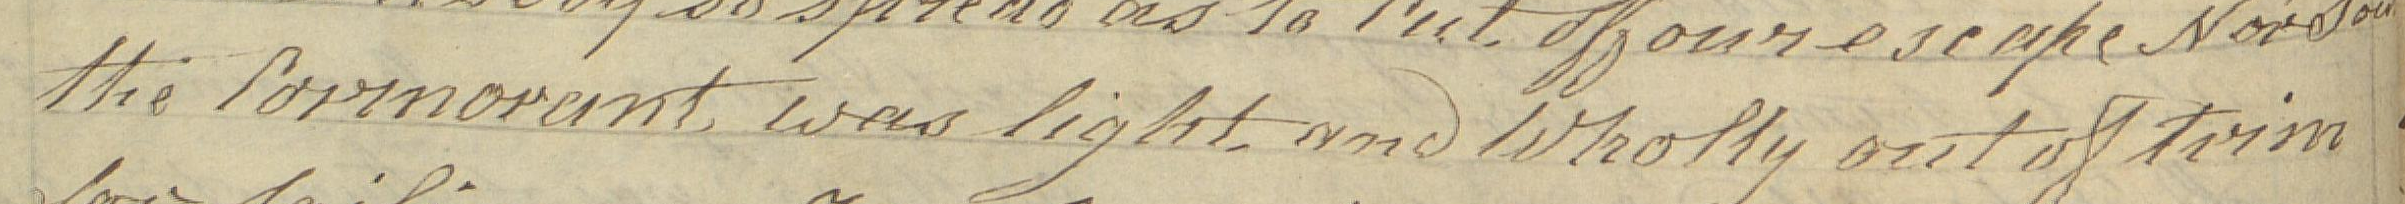the Cormorant was light and Wholly out of trim
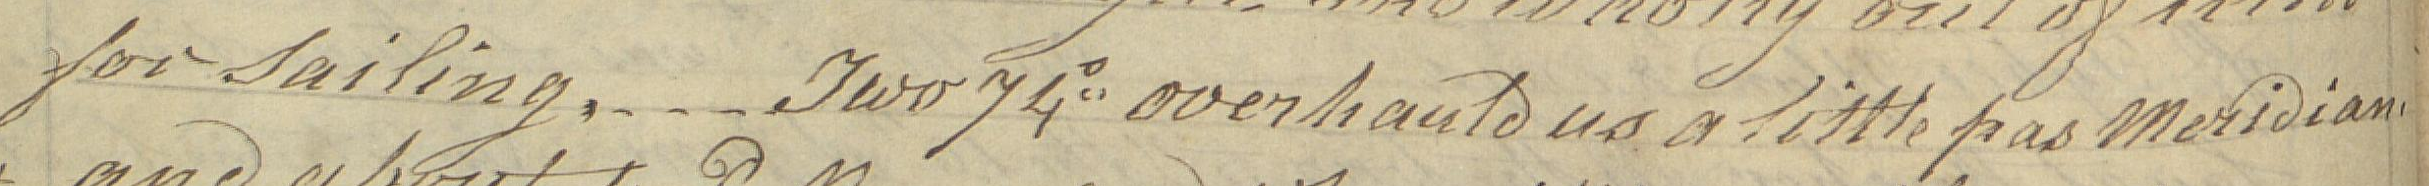for Sailing. Two 74. overhauld us a little pas Meridian
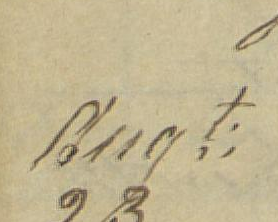Aug^t:
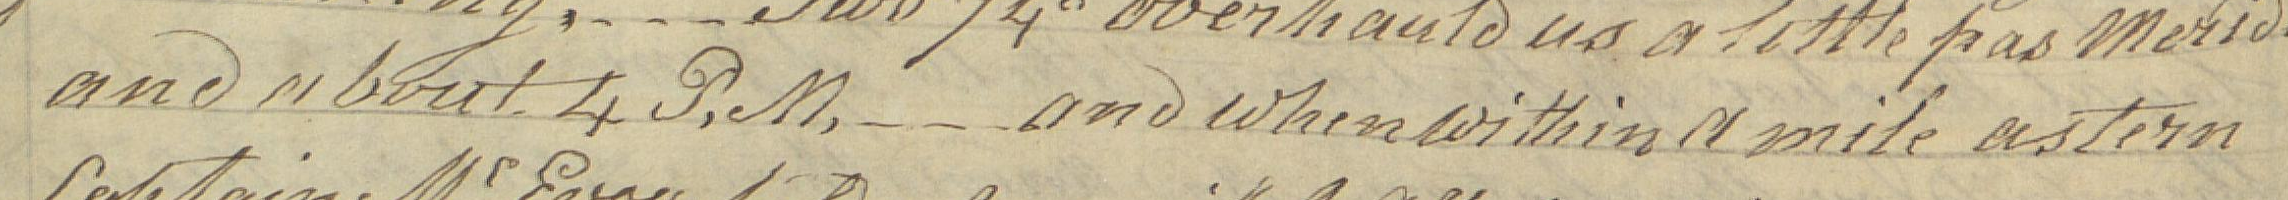and about 4 P.M. and when within a mile astern
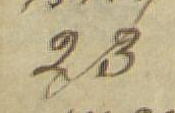23
